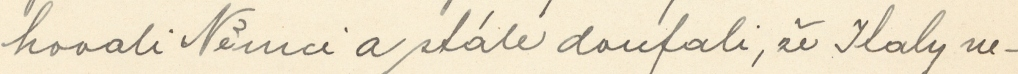hovali Němci a stále doufali, že Italy ne-
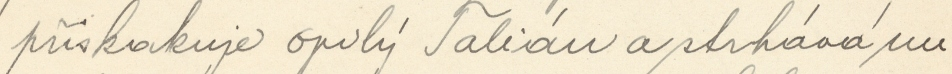přiskakuje opilý Talián a strhává mi
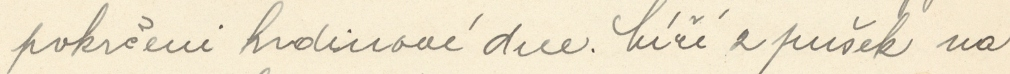pokrčeni hrdinové dne. Míří z pušek na
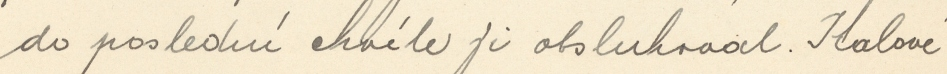do poslední chvíle ji obsluhoval. Italové
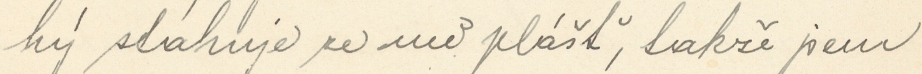hý stahuje ze mě plášť, takže jsem
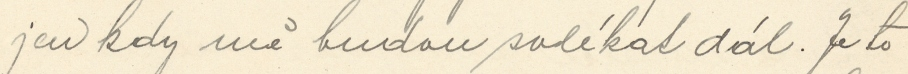jen kdy mě budou svlékat dál. Je to
